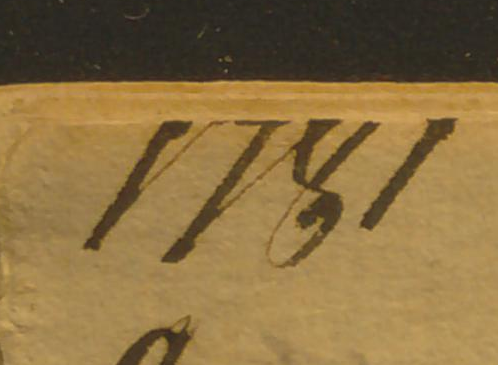1781
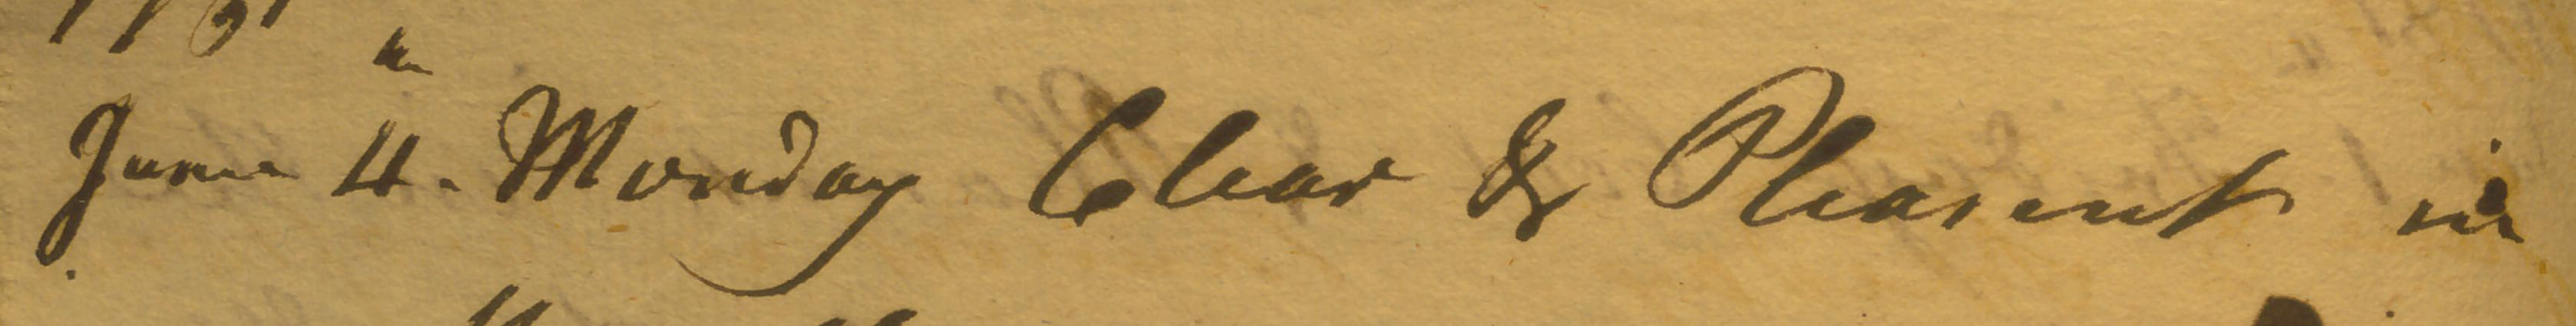June 4^th. Monday Clear & Pleasent in
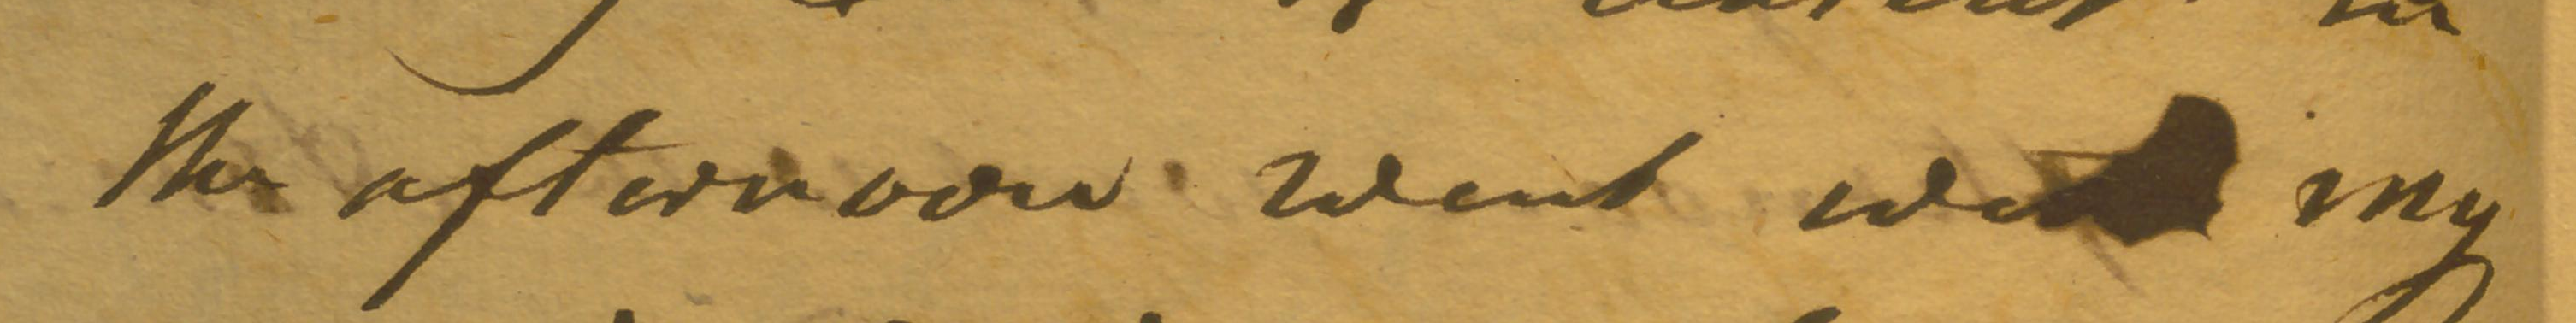the afternoon went with my
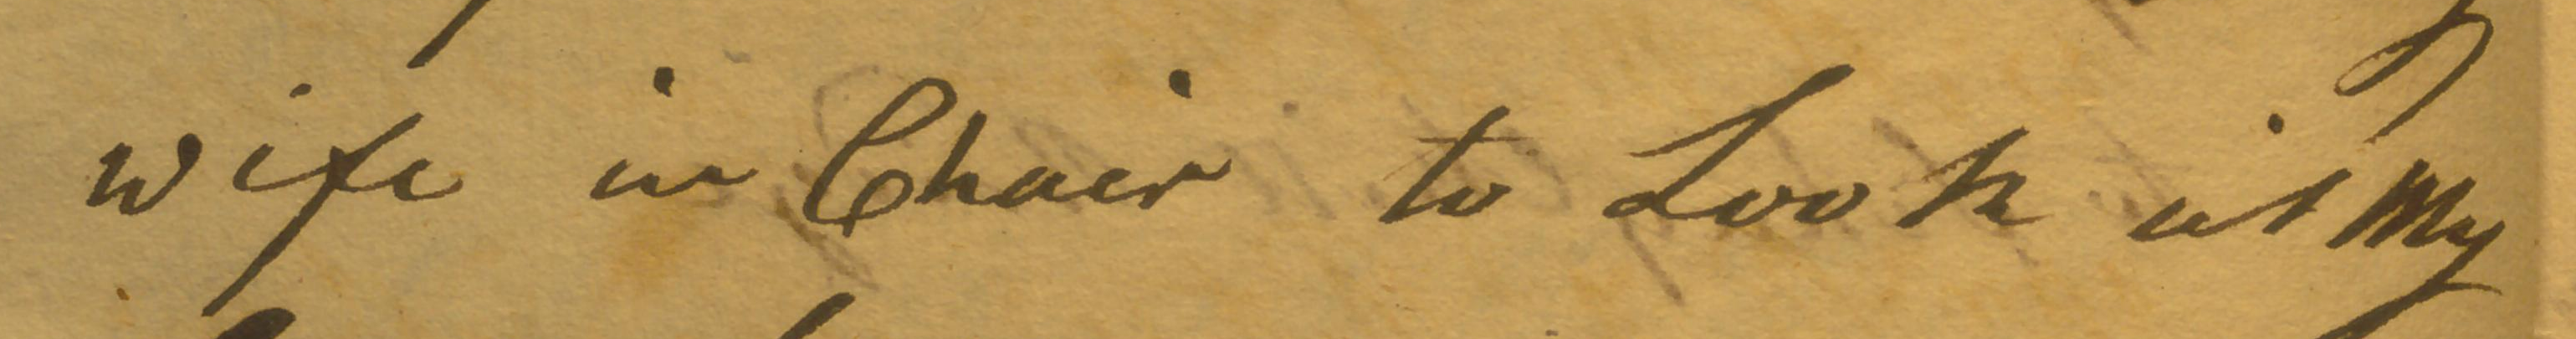wife in Chair to Look at My
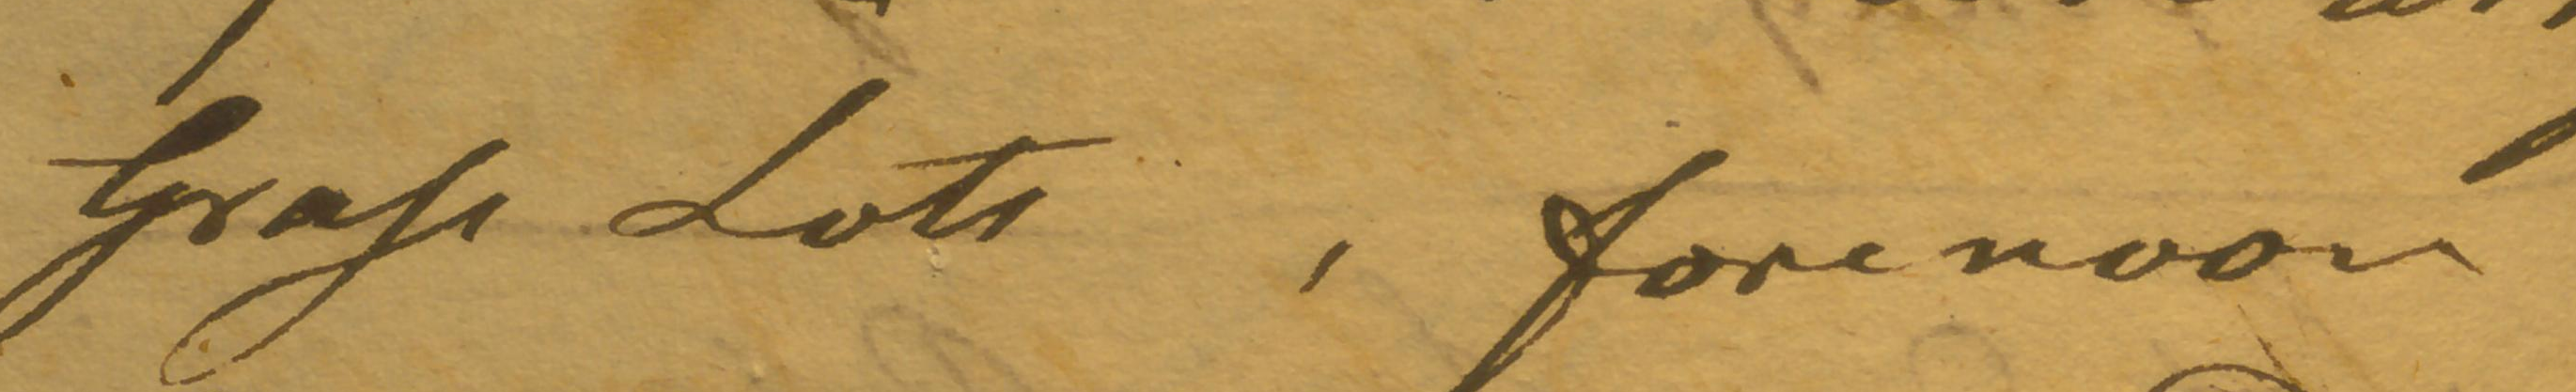Grass Lots, forenoon
